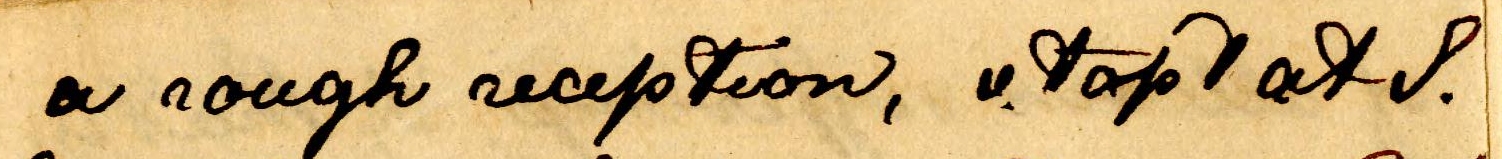a rough reception, stopt at S.
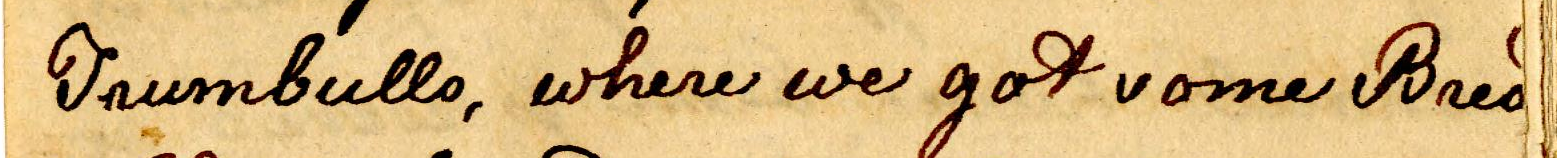Trumbulls, where we got some Bred
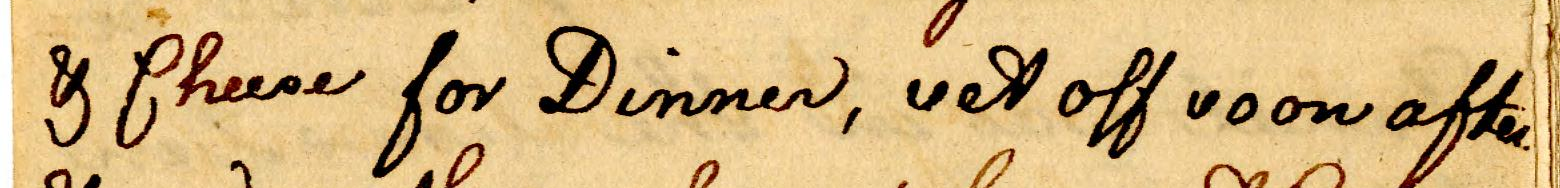& Cheese for Dinner, set off soon after
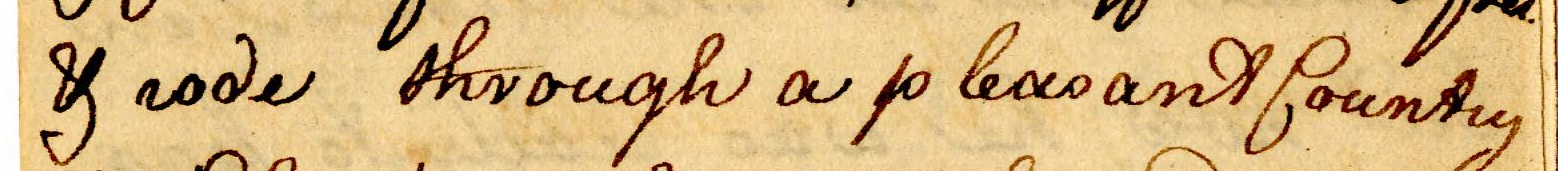& rode, through a pleasant Country
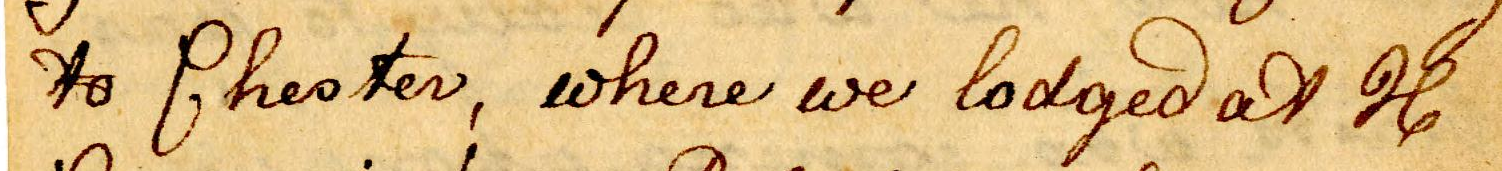to Chester, where we lodged at H
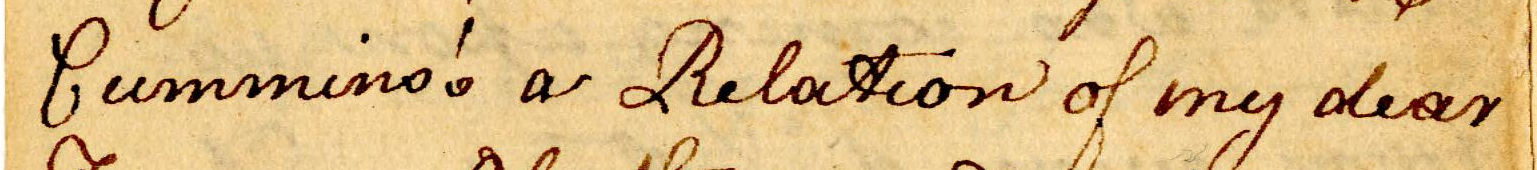Cummins's a Relation of my dear
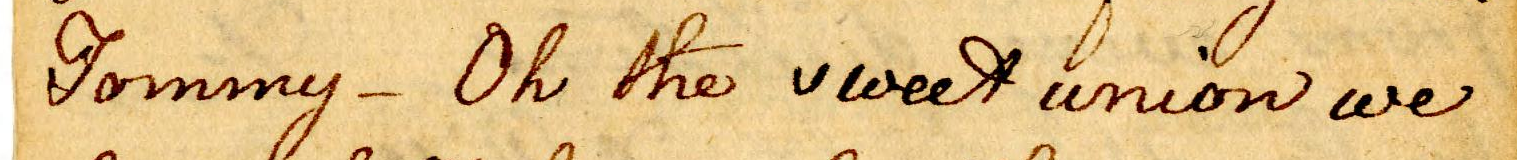Tommy- Oh the sweet union we
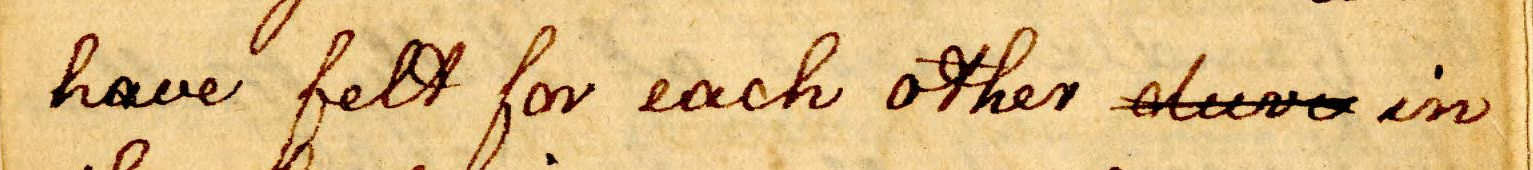have felt for each other [duri] in
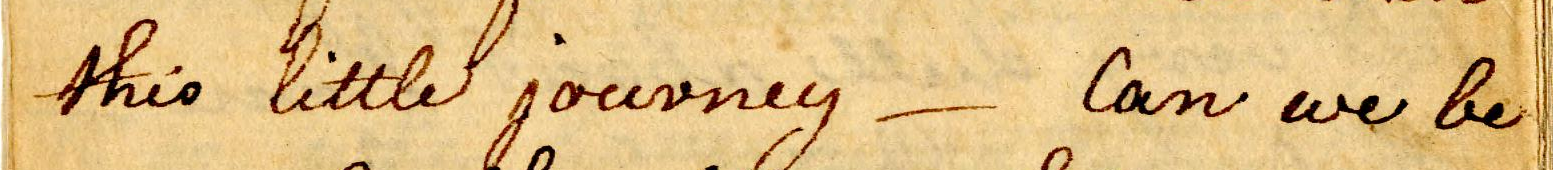this little journey- Can we be
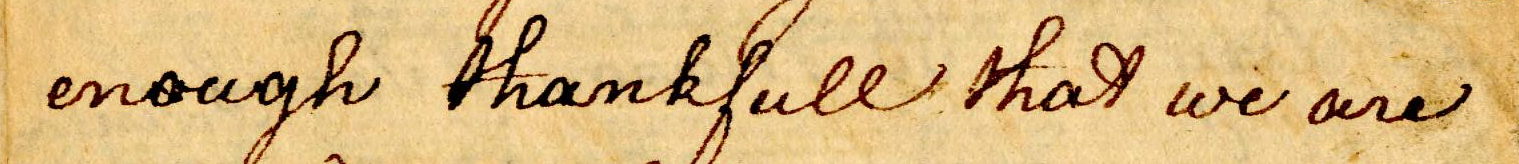enough thankfull that we are
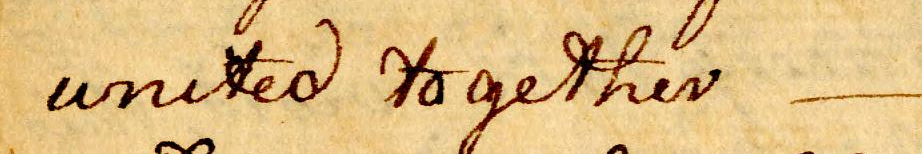united together-
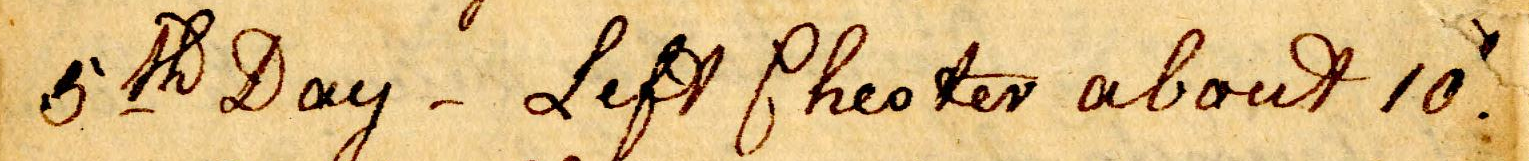5^th Day- Left Chester about 10
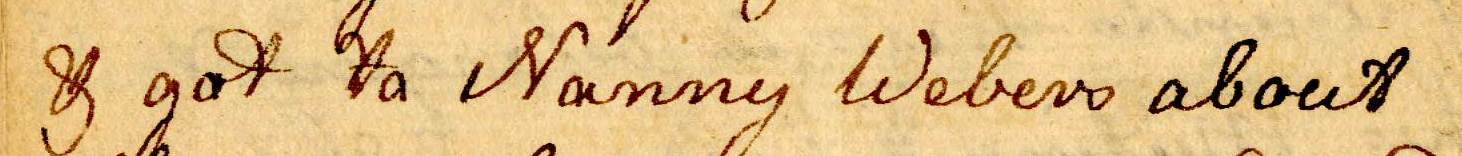& got to Nanny Webers about
